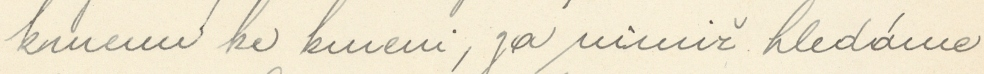kmenu ke kmeni, za nimiž hledáme
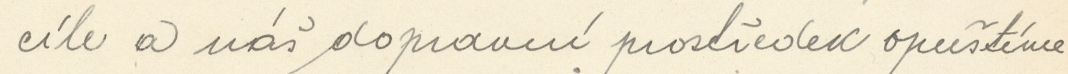cíle a náš dopravní prostředek opuštíme.
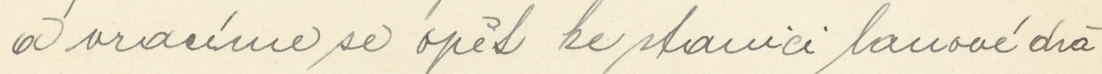a vracíme se opět ke stanici lanové drá-
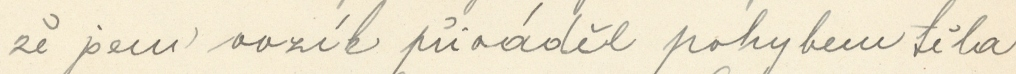že jsem vozík přiváděl pohybem těla
